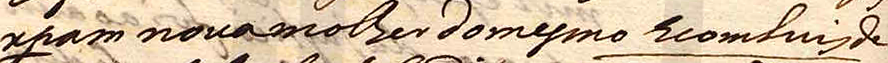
xꝑam noua molher do mesmo E com Luis de
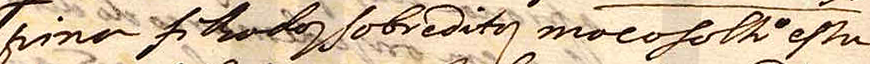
pina filho doz sobreditoz moco soltro estu
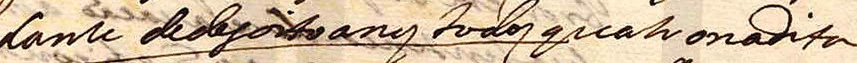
dante de desoito anoz todoz quatro na dita
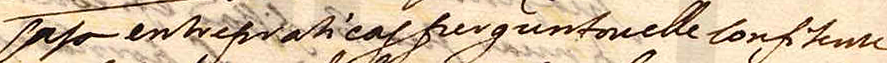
Casa entre praticas perguntou elle confitente
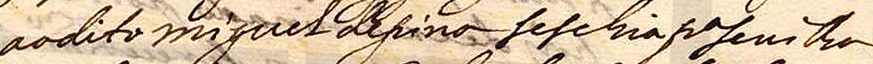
ao dito migueL de pina se se hia pa seuilha
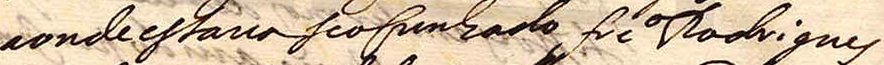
aonde estaua seo Cunhado frco Rodrigues
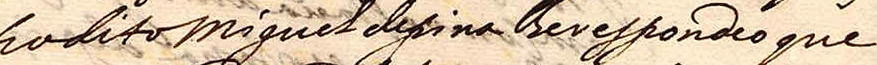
E o dito MigueL de pina lhe respondeo que
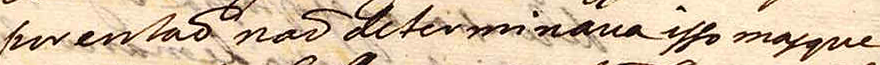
por entaõ naõ determinaua isso mas que
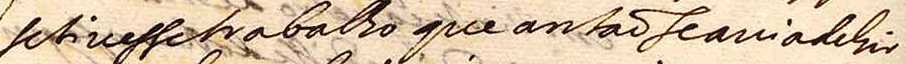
se tiuesse trabalho que antaõ se auia de hir
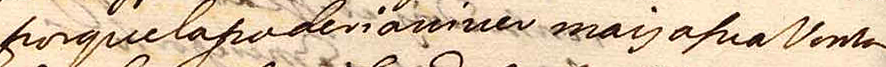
porque la poderia uiuer mais a sua Vonta
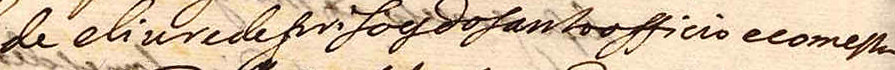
de e liure de prisoes do santo officio e com essa
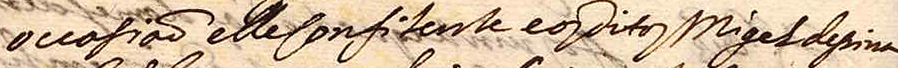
occasião elle Confitente e oz ditoz MigeL de pina
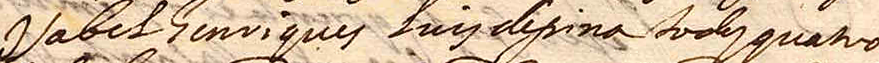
JsabeL henriques Luis de pina todoz quatro
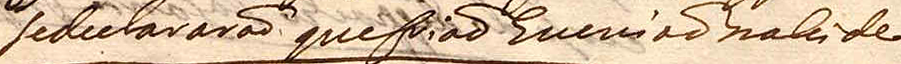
se declararaõ que Crião E ueuiaõ na lei de
